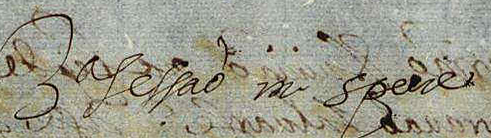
3a sessaõ in specie
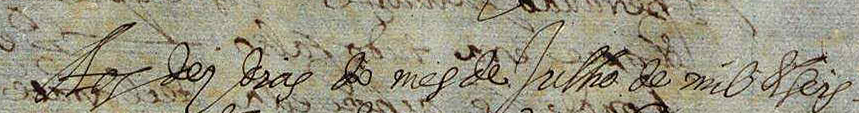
Aos dez dias do mes de Julho de mil & seis
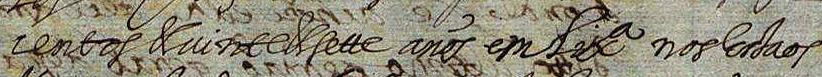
centos & uinte & sette anōs em Lixa nos Estaos
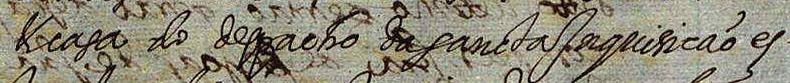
& casa do despacho da sancta Jnquisiçaõ es
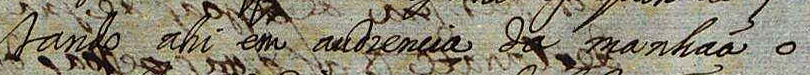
tando ahi em audiencia da manhaã o
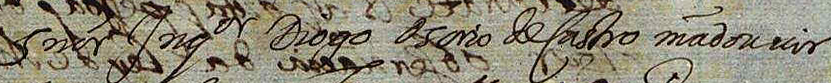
Snōr Jnqor Diogo Osorio de Castro mādou uir
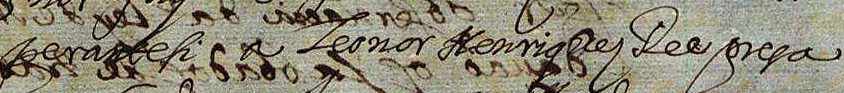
perante si a Leonor Henriquez Ree presa
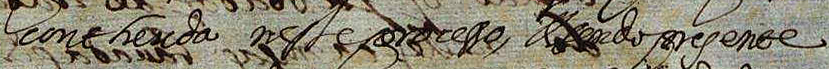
contheuda neste processo, & sendo presente
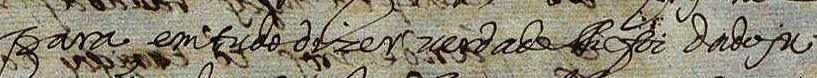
para em tudo dizer uerdade lhe foi dado ju
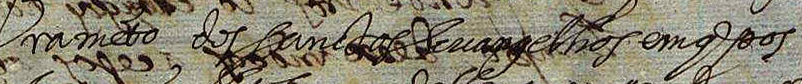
ramēto dos sanctos Euangelhos em q̄ pos
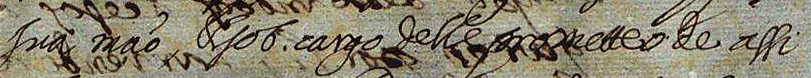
sua maõ, & sob cargo delle prometteo de assi
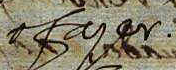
o fazer.
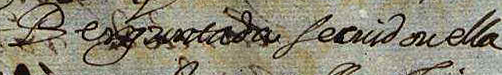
Perguntada se cuidou ella
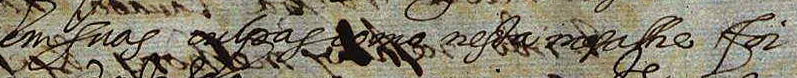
em suas culpas como nesta mesa lhe foi
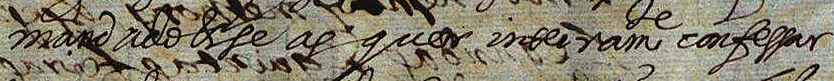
mandado & se as quer inteiramte confessar
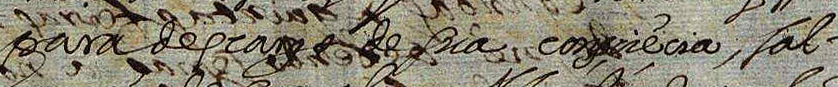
para descargo de sua consciēcia, sal
